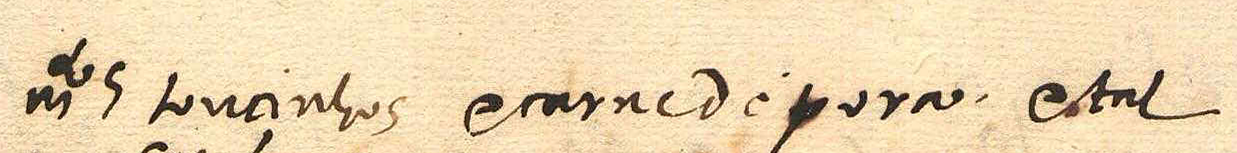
mtos toucinhos e carne de porco. e taL
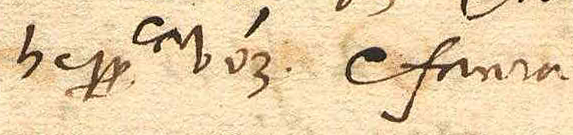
he ꝓpca voz e fama
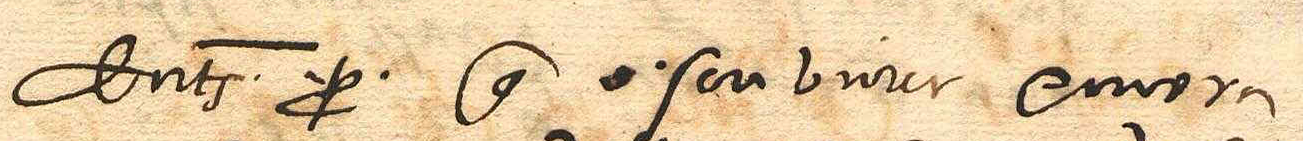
Ent̄ꝭ ꝓ. q̄ o seu viuer e mora
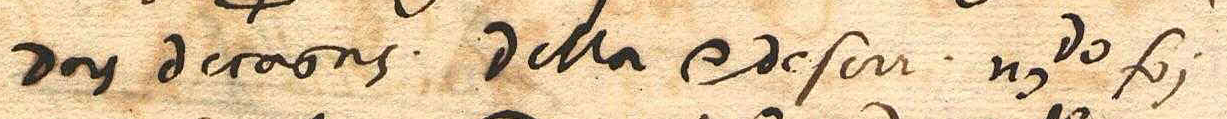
das de casas della e de seu mdo foj
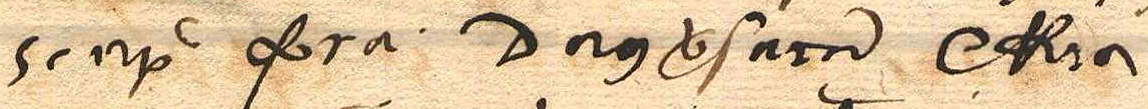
senp̄ fora. da ꝯꝟsaçā e Rua
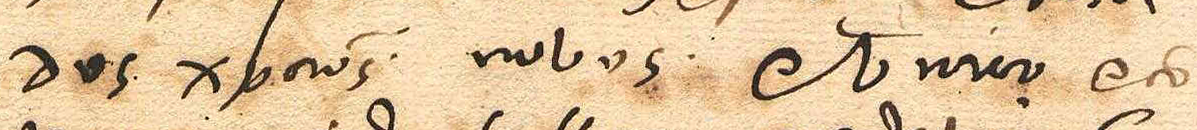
dos xpaõs novos. e viueo e cō
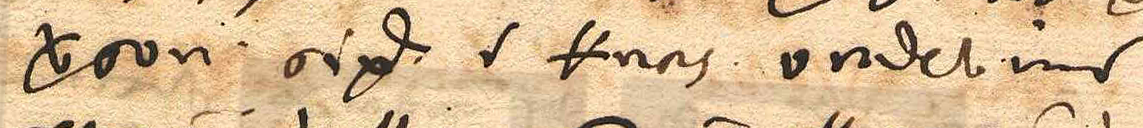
ꝟsou sēp̄ ē Ruas onde viuē
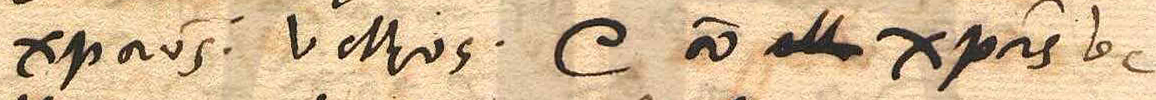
xpãos velhos. e cō ell xpās ve
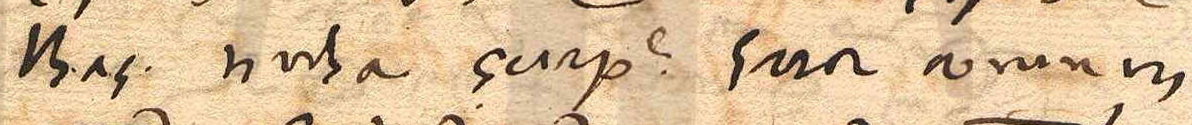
lhas tinha senp̄ sua comuni
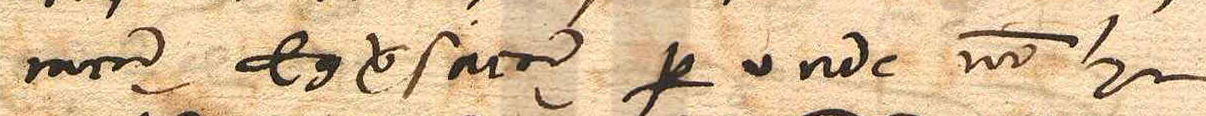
caçā E ꝯꝟsaçā ꝑ onde n̄o he
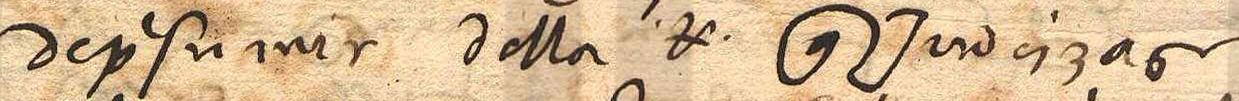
de p̄sumir della .R. q̄ Judaizase
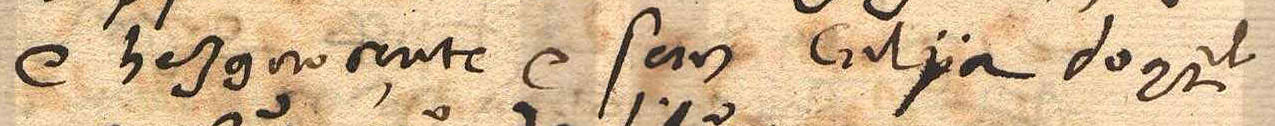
e he Jgnocente e sem culpa do ꝯtdo
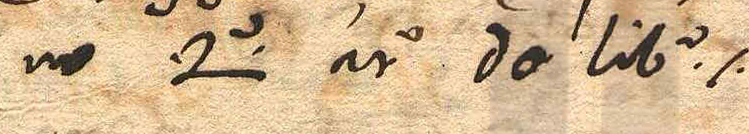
no .2o. aro do libo ./.
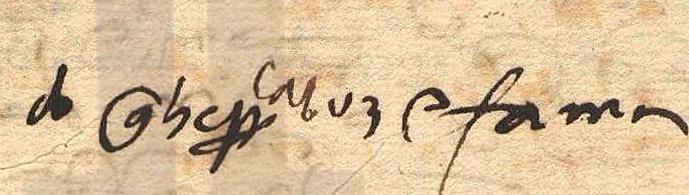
do q̄ he ꝓca voz e fama
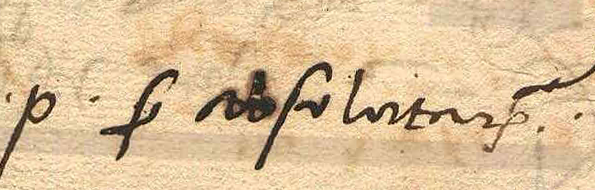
p. ꞩ absoluta cꝭ̄
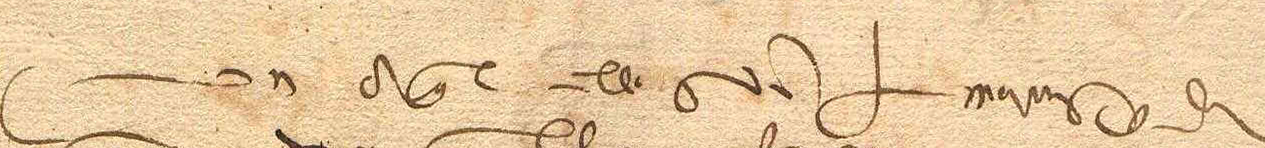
Com A q̄l elle sor̄ Jmquisydor
